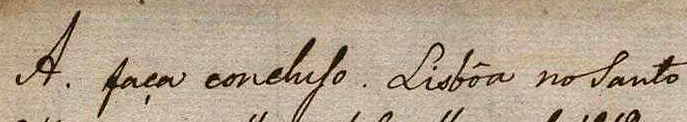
A. faça concluso. Lisbôa no Santo
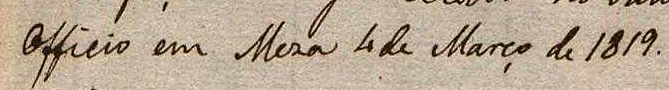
Officio em Meza 4 de Março de 1819.
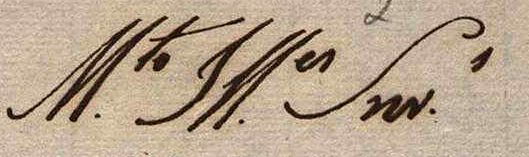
M.to Ill.es Snr.s
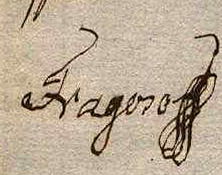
Fragoso
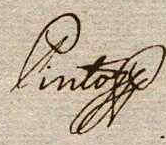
Pinto
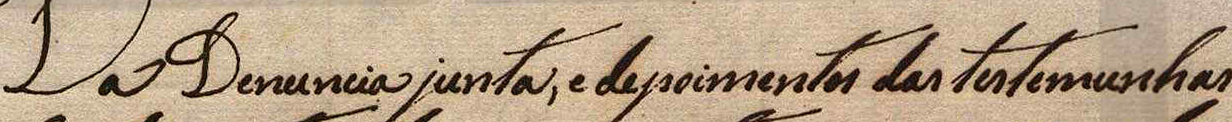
Da Denuncia junta, e depoimentos das testemunhas
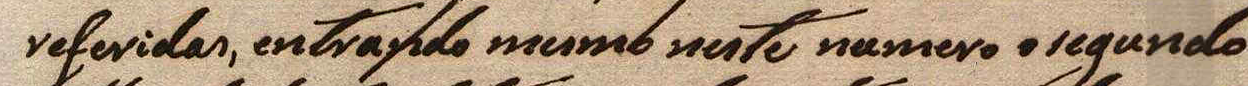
referidas, entrando mesmo neste numero o segundo
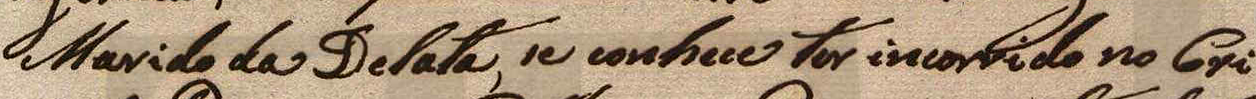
Marido da Delata, se conhece ter incorrido no Cri
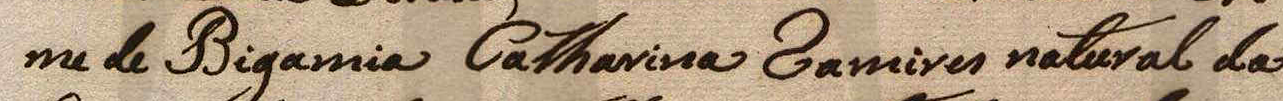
me de Bigamia Catharina Ramires natural da
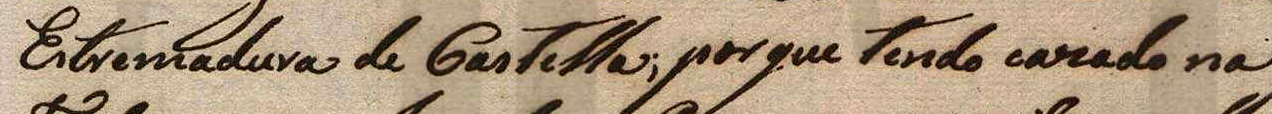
Estremadura de Castella; porque tendo cazado na
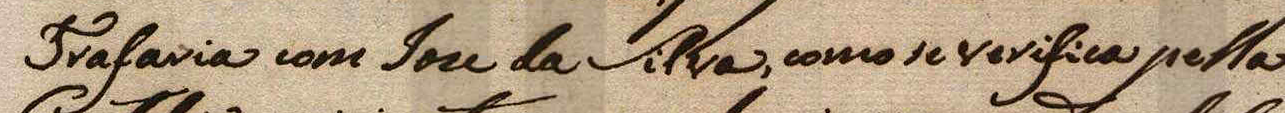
Trafaria com Ioze da Silva, como se verifica pella
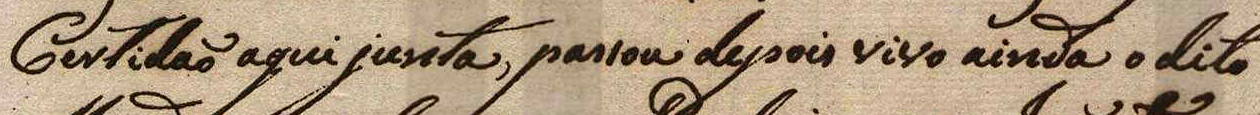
Certidaõ aqui junta, passou depois vivo ainda o dito
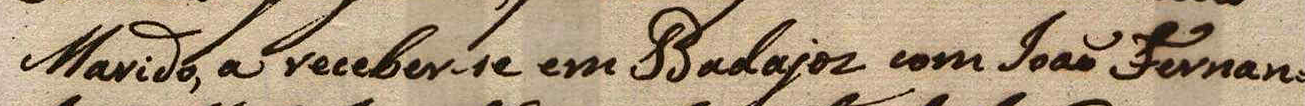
Marido, a receber-se em Badajoz com Ioaõ Fernan
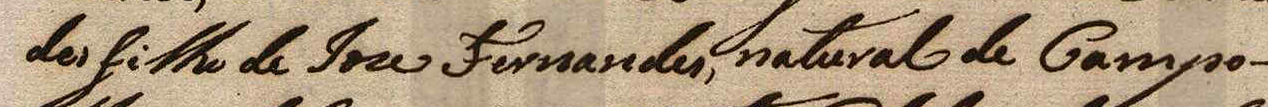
des filho de Ioze Fernandes, natural de Campo
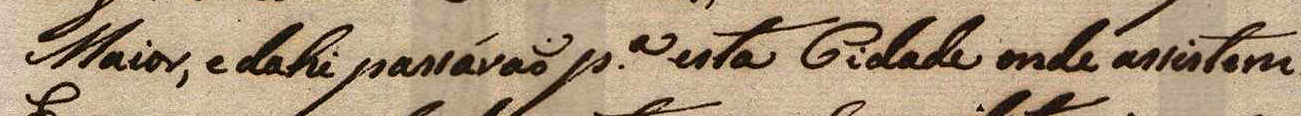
Maior, e dahi passaraõ p.a esta Cidade onde assistem.
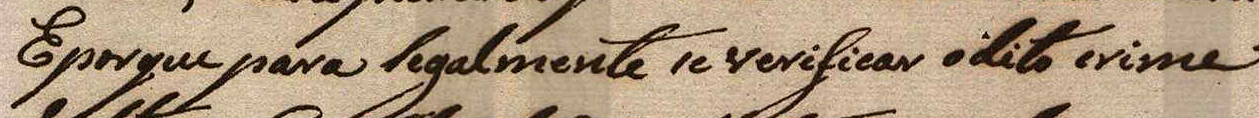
E porque para legalmente se verificar o dito crime
